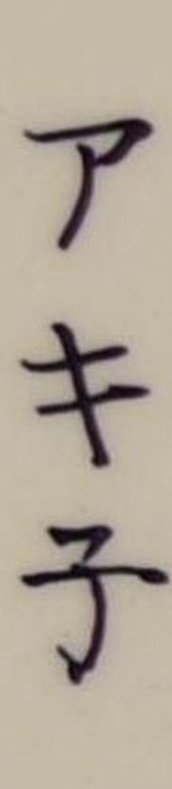アキ子
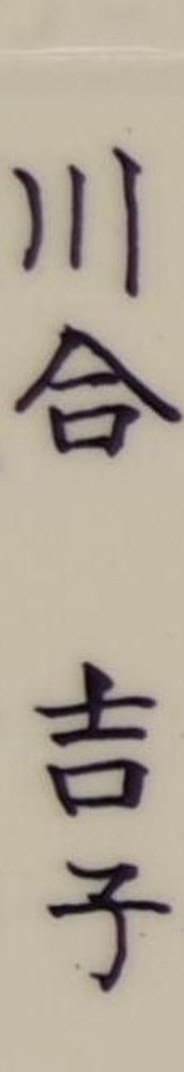川合吉子

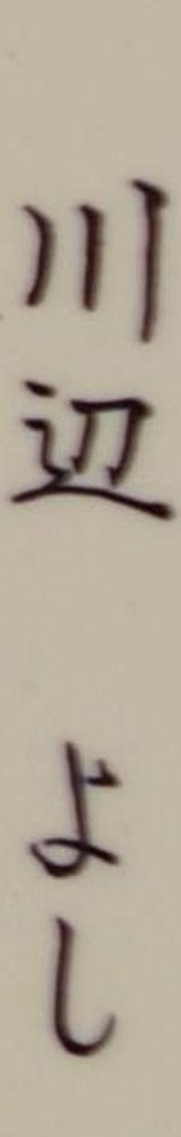川辺よし
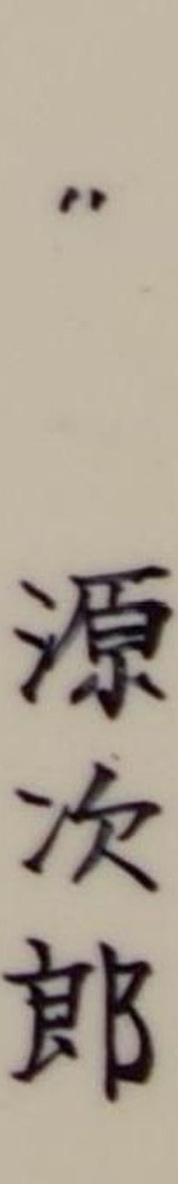源次郎
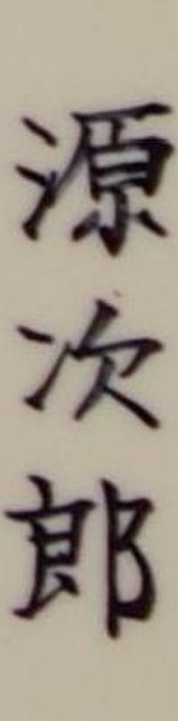源次郎
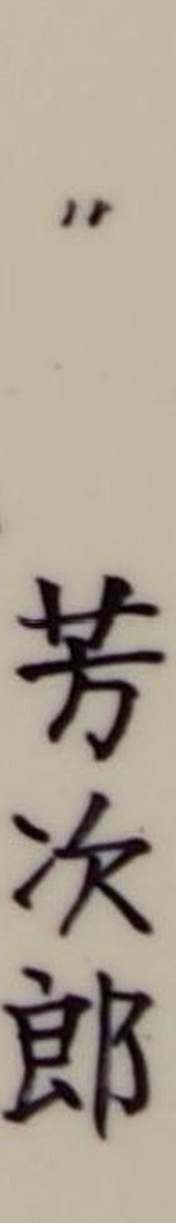芳次郎
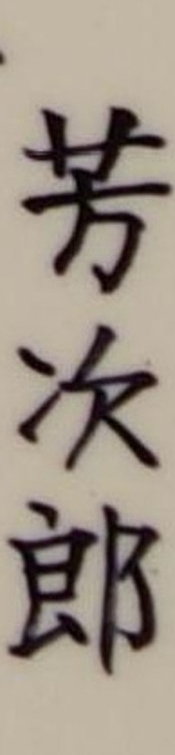芳次郎
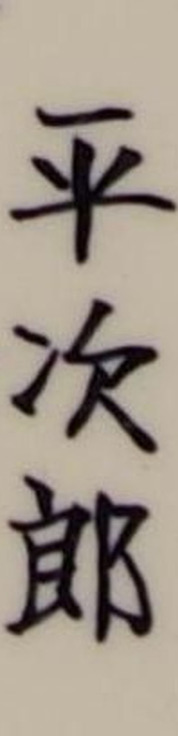平次郎
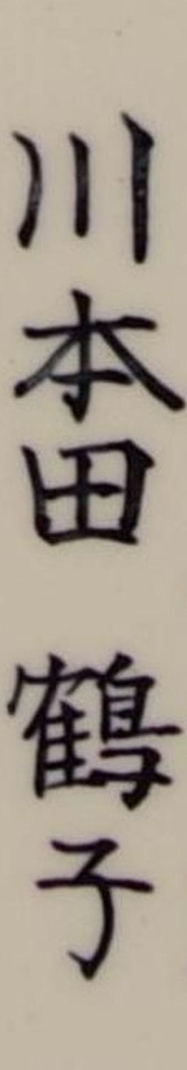川本田鶴子
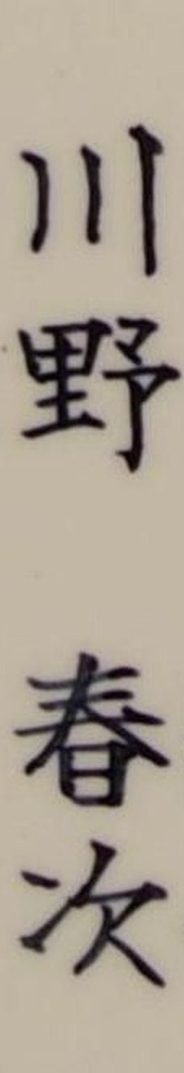川野春次
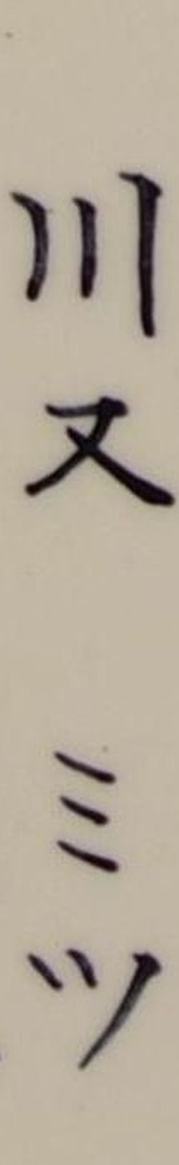川又ミツ
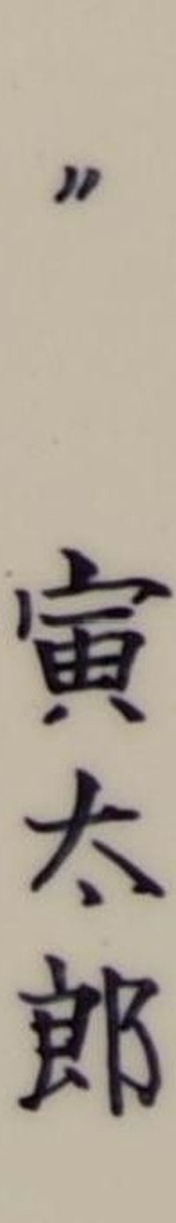寅太郎
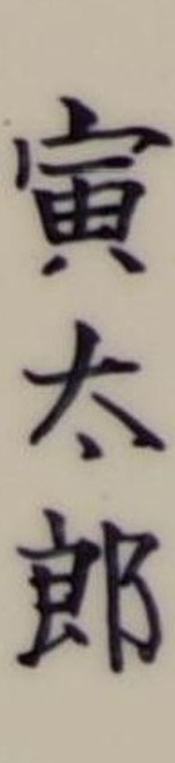寅太郎
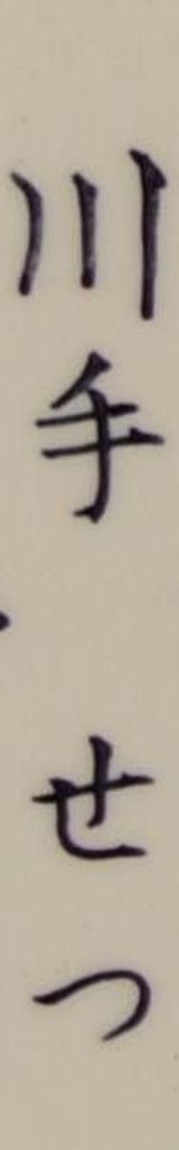川手せつ
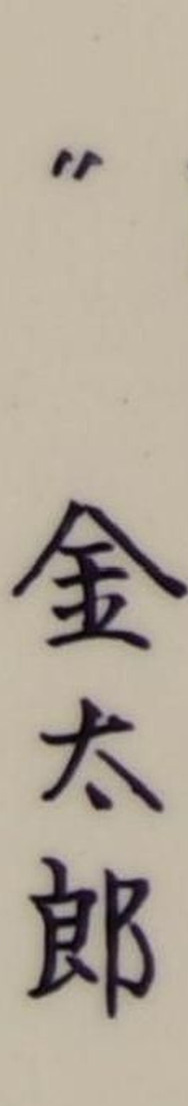金太郎
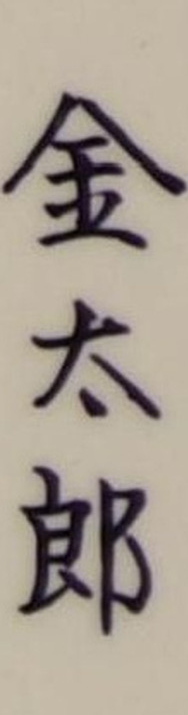金太郎
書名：M~S
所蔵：高野山金剛峯寺
